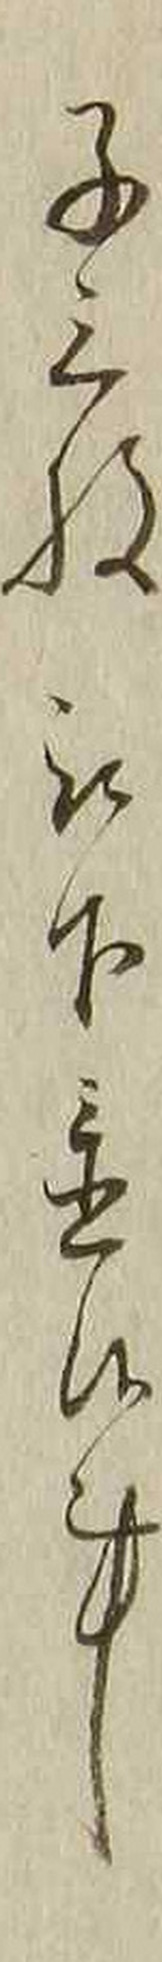子三枚被下置候事
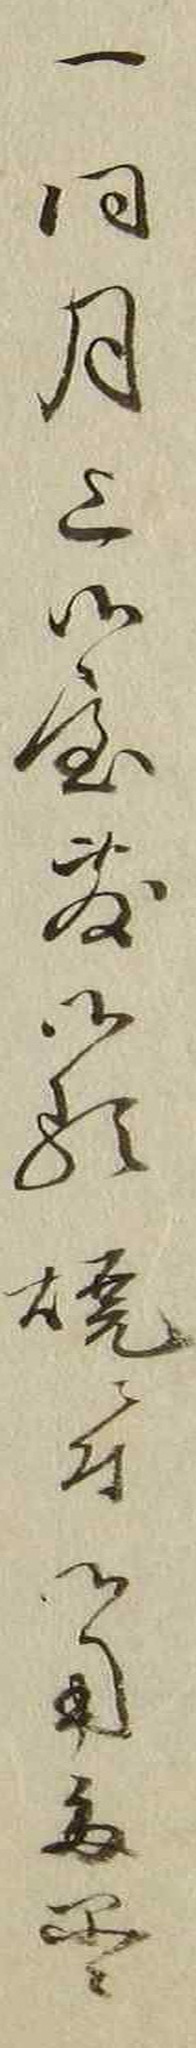一同月上御屋敷御類焼ニ付御用多品々
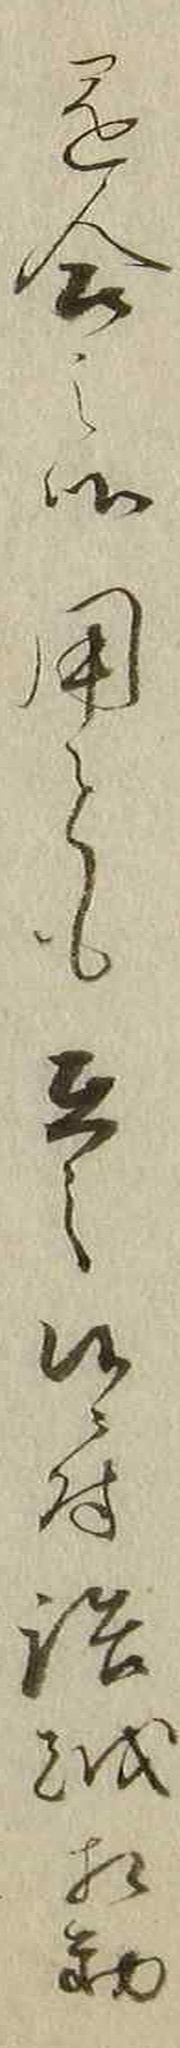懸合之御用とも在之候ニ付詰越相勤
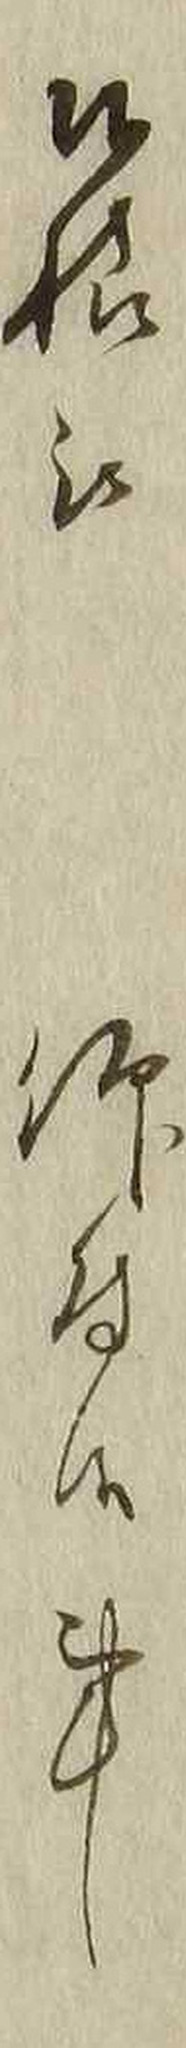候様被仰付候事
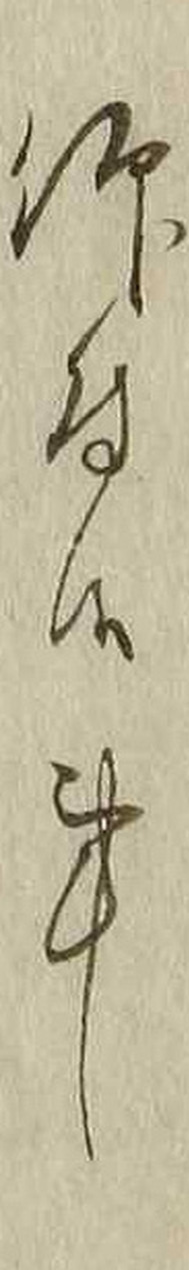仰聞候事
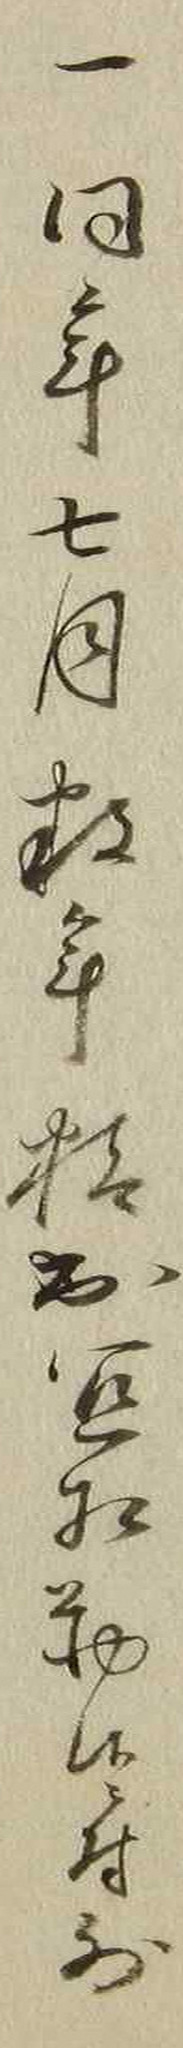一同年七月数年精出宜相勤候ニ付外
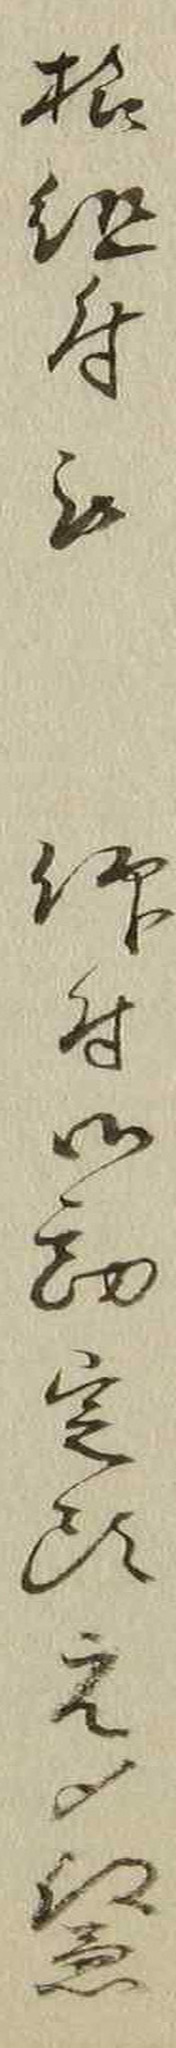様組付被仰付御勘定頭元〆役兼
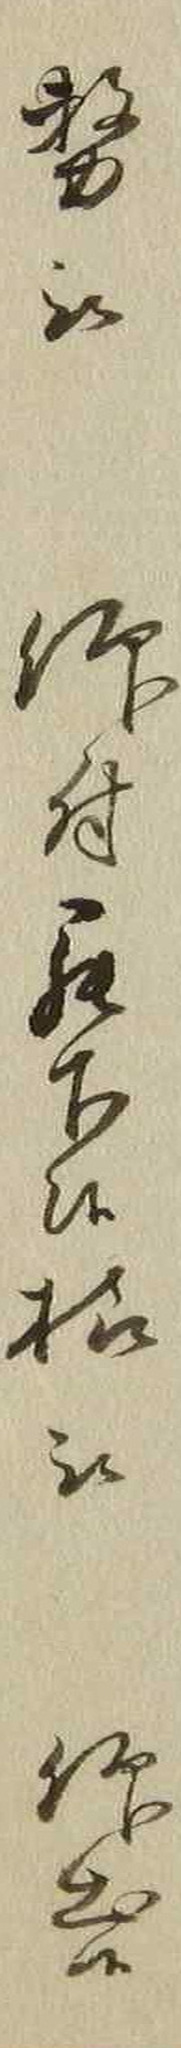務被仰付罷下候様被仰出候
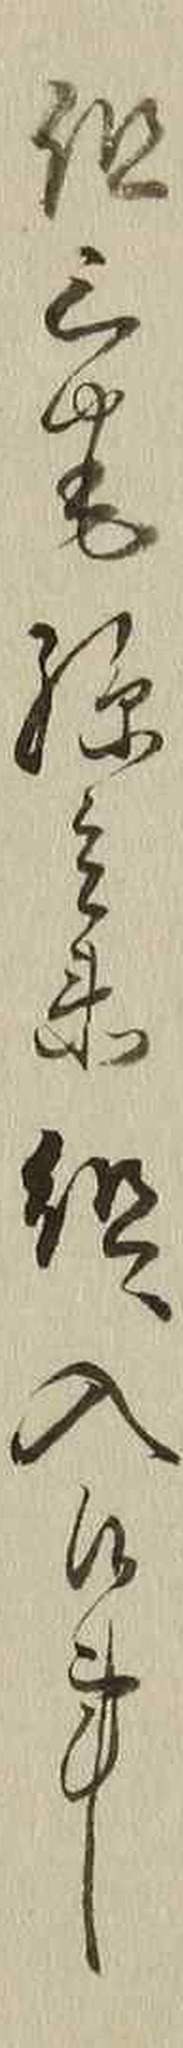但三宅孫兵衛組へ入候事
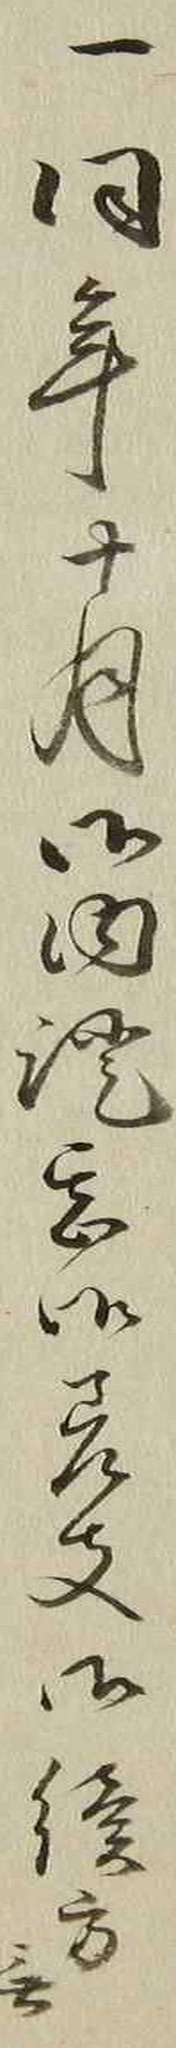一同年十月御内証甚御差支御続方無
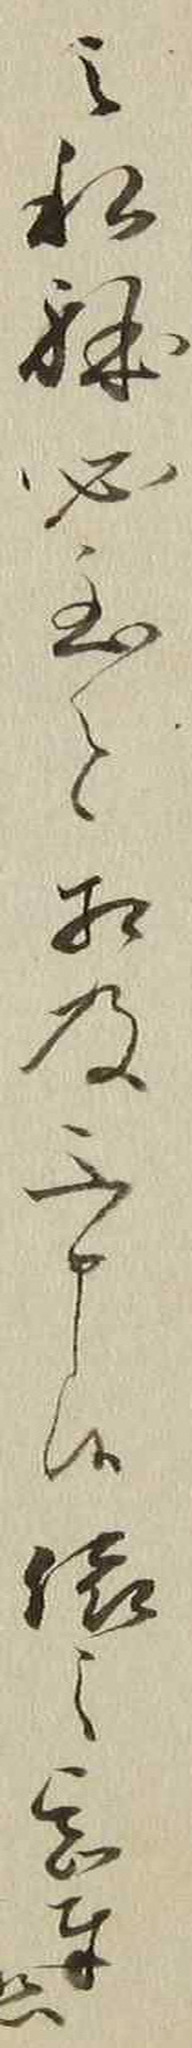之私体必至と相及不申候依之甚奉恐
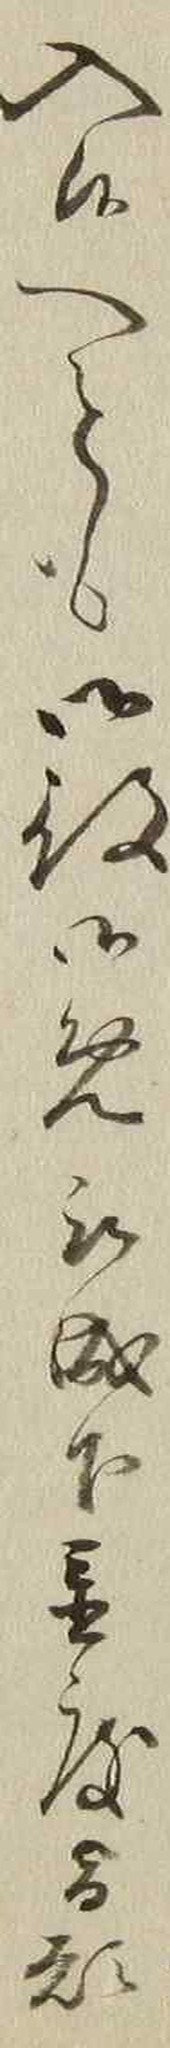入候へとも御役御免被成下置度旨願
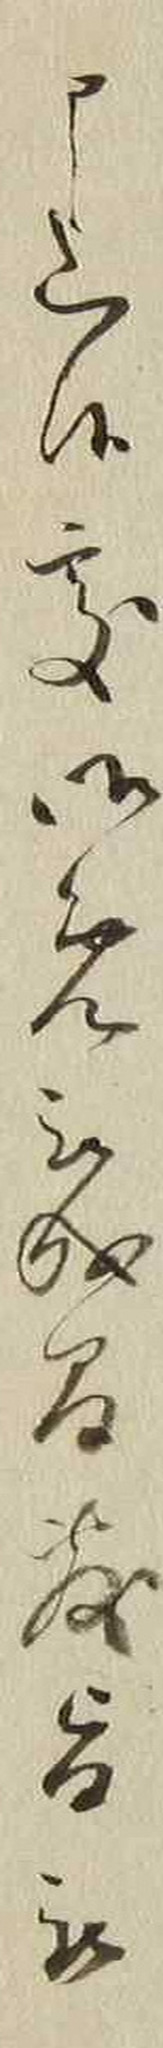申上候処御免被成間敷旨被
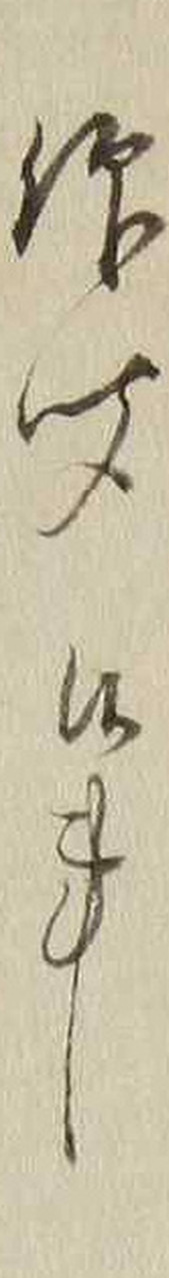仰聞候事
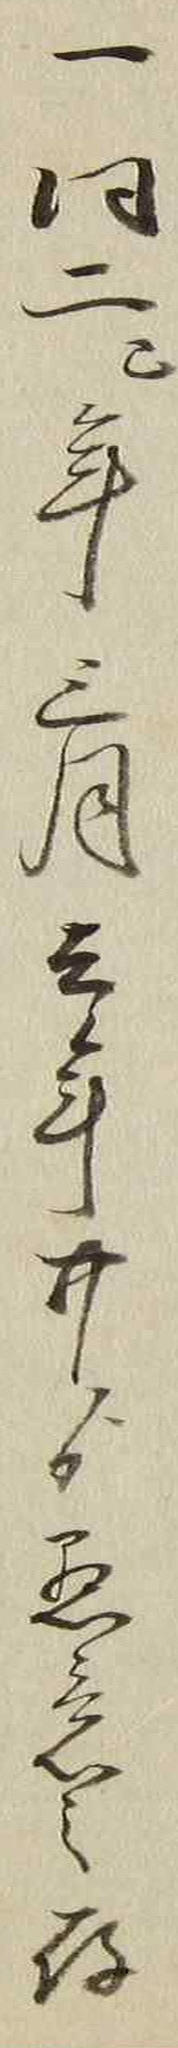一同二巳年三月去年中ゟ愚意之存
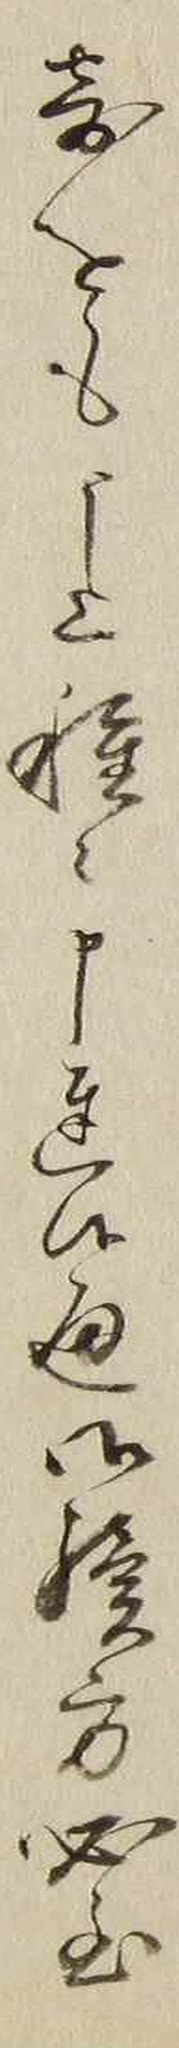寄をも申上種々申達候通御続方必至
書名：諸士系譜　巻之52　に之部3
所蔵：会津若松市立会津図書館
